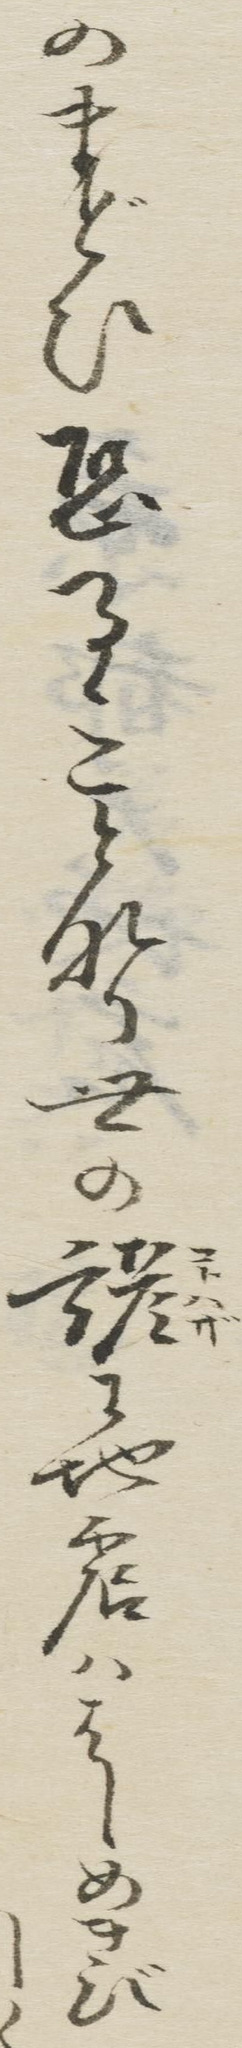のまどひ恐るゝことなり世の諺に地震ハはじめきびしく
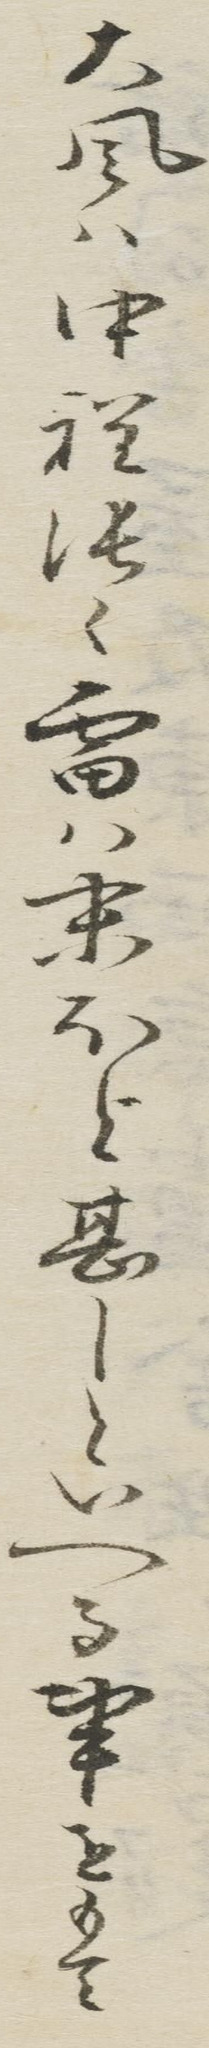大風ハ中程強く雷ハ末なと甚しといへる事をもて
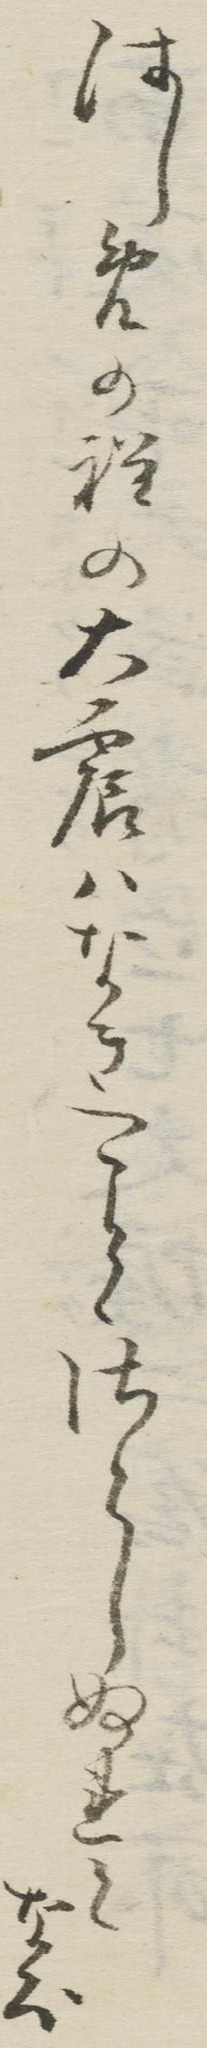はしめの程の大震ハなきことゝさとしぬれとなお
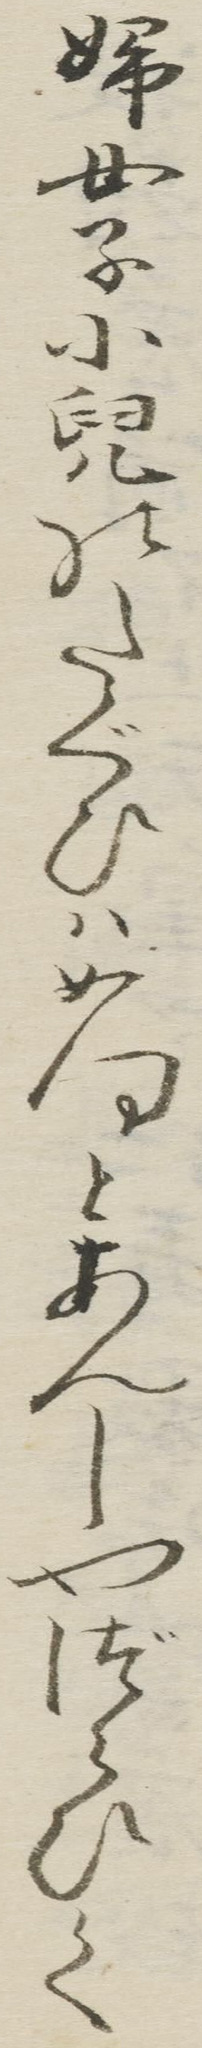婦女子小児のたぐひハ如何とあんしつづらひて
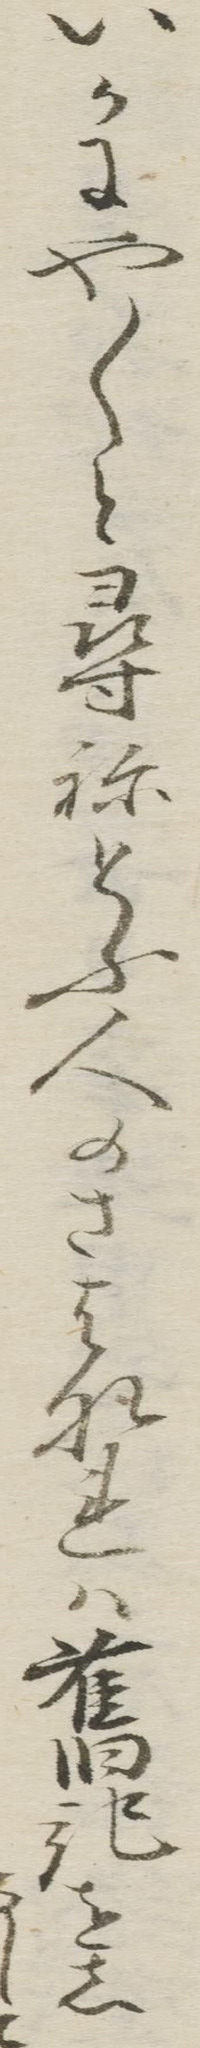いかにや〳〵と尋ねとふ人のさはなれハ旧記をしるして
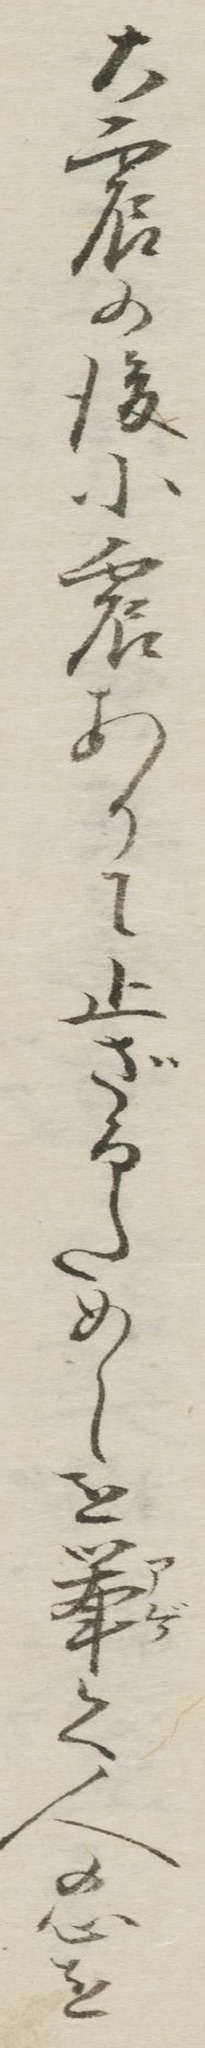大震の後小震ありて止ざるためしを挙て人の心を
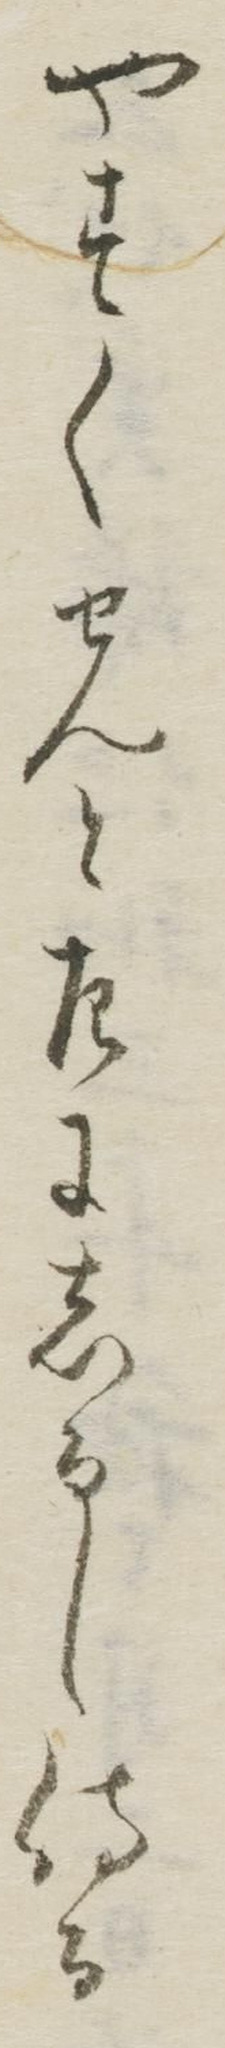やすセんト左にしるし侍る
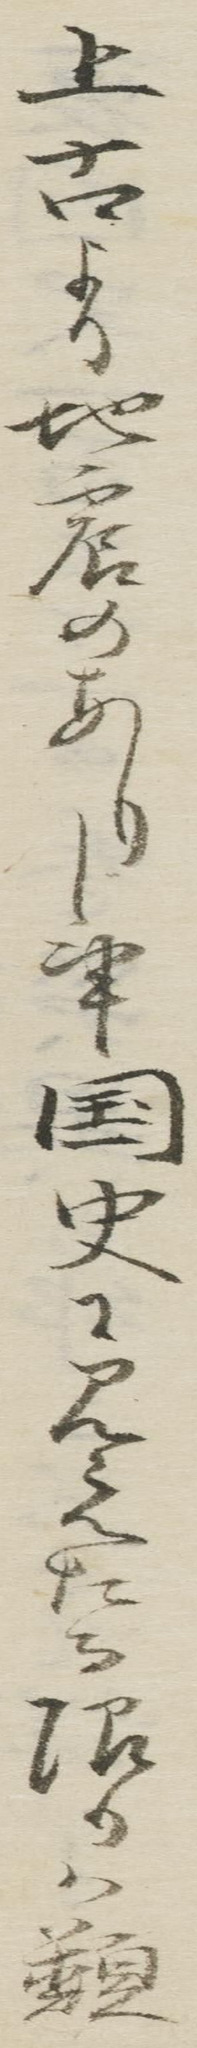上古より地震のありし事国史に見えたる限りハ類

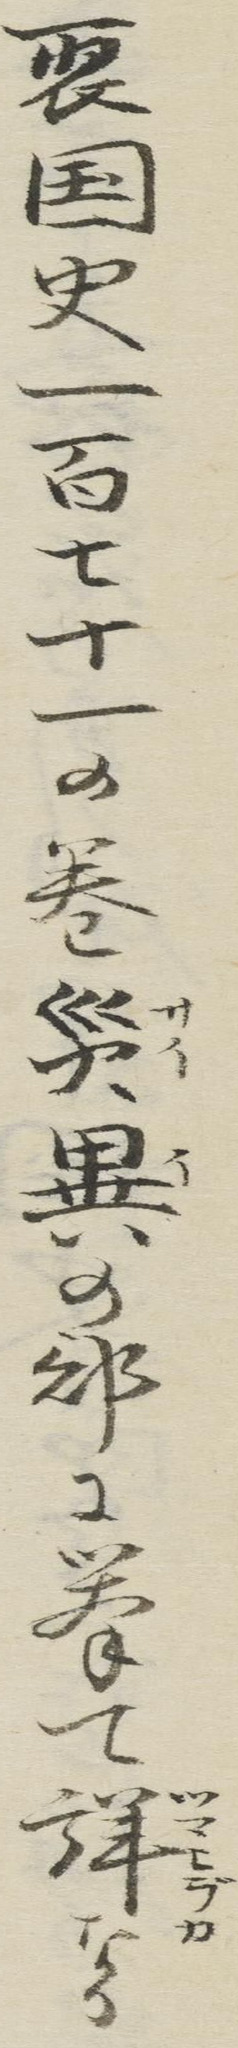聚国史一百七十一の巻災依異の部に挙て詳なり
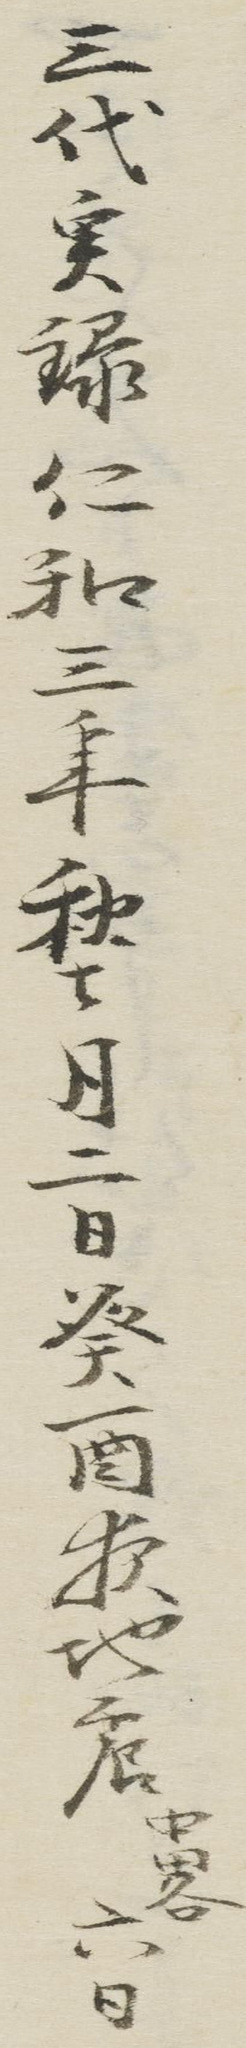三代実録仁和三年秋七月二日癸酉夜地震中略六日
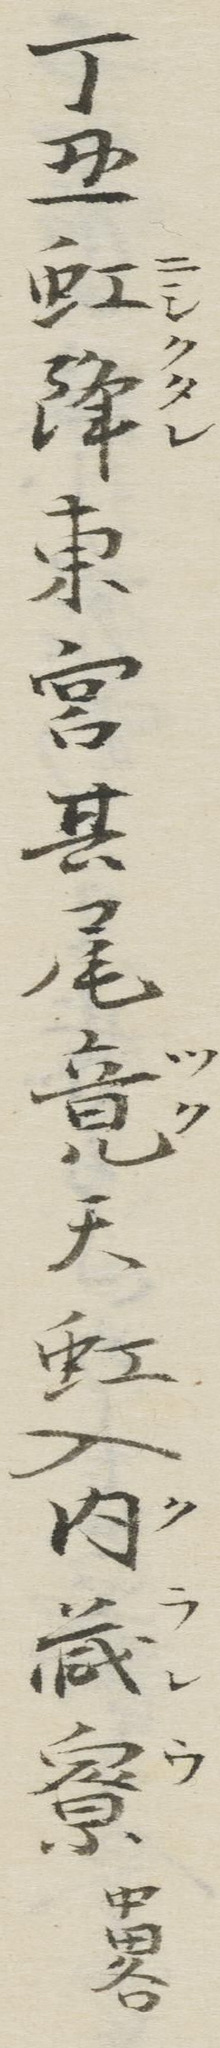丁丑虹降東宮其尾竟天虹入内蔵寮中略
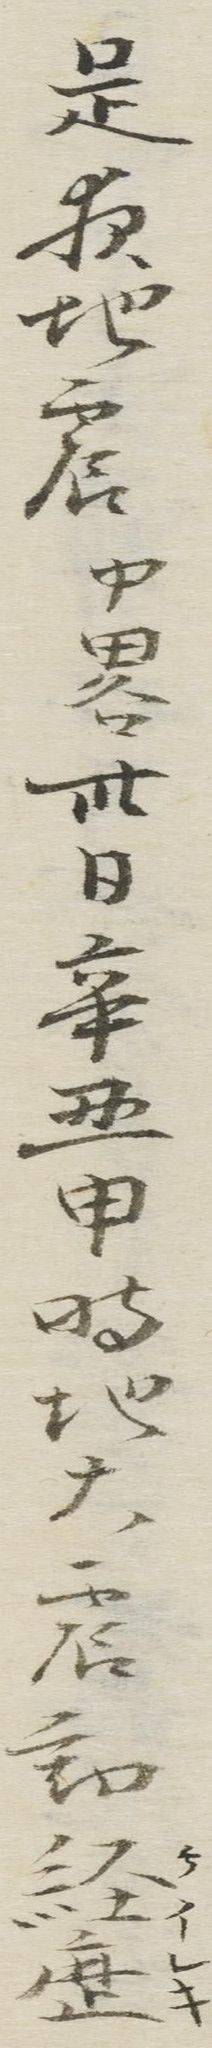是夜地震中略卅日辛丑申時地大震動経歴
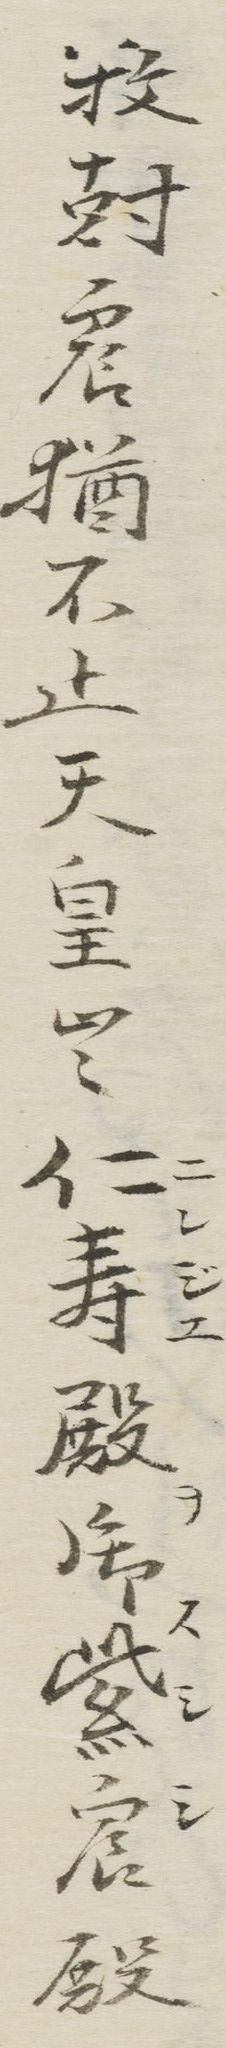数刻震猶不止天皇出仁寿殿ヲ御ス紫宸殿
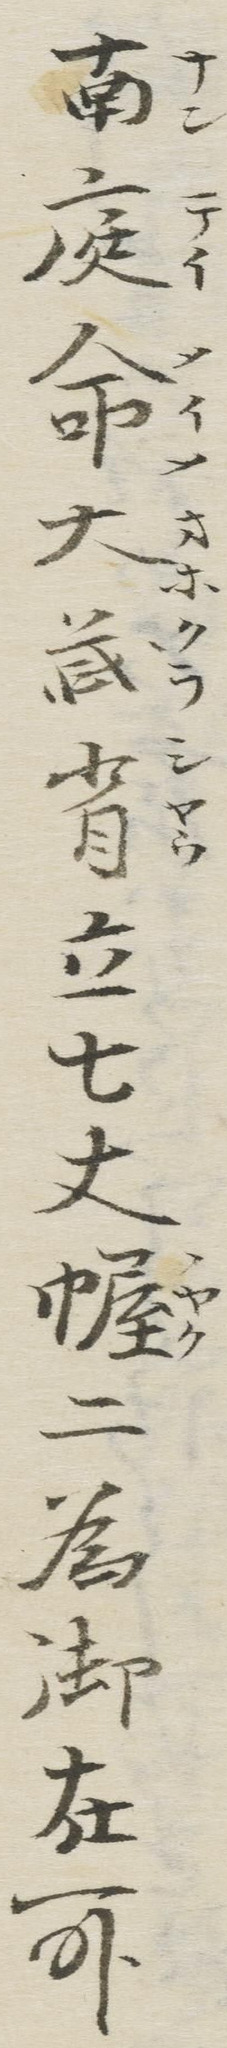南庭命大蔵省立七丈幄二為御在所
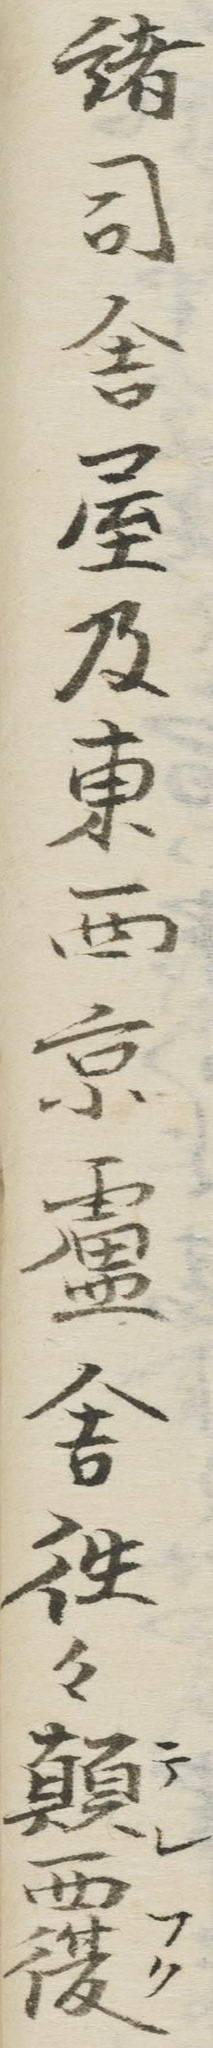諸司舎屋及東西京蘆舎往々顚覆
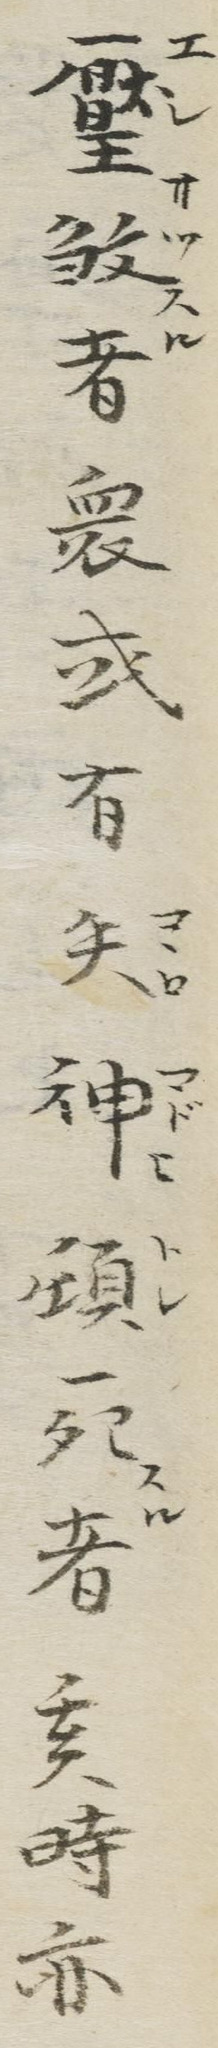壓殺者衆或有失神頓死スル者亥時亦
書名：諸国大地震大津波一代記
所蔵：東京大学地震研究所図書室 Earthquake Research Institute Library, The University of Tokyo, JAPAN
